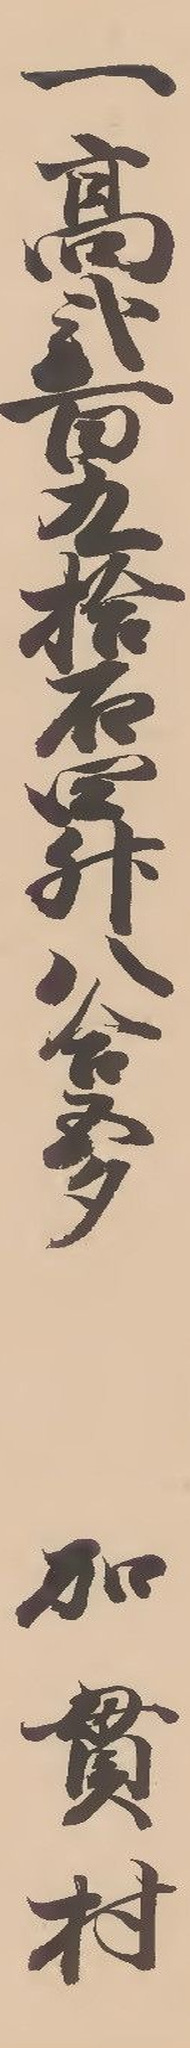一高弐百九拾石四升八合五勺加貫村
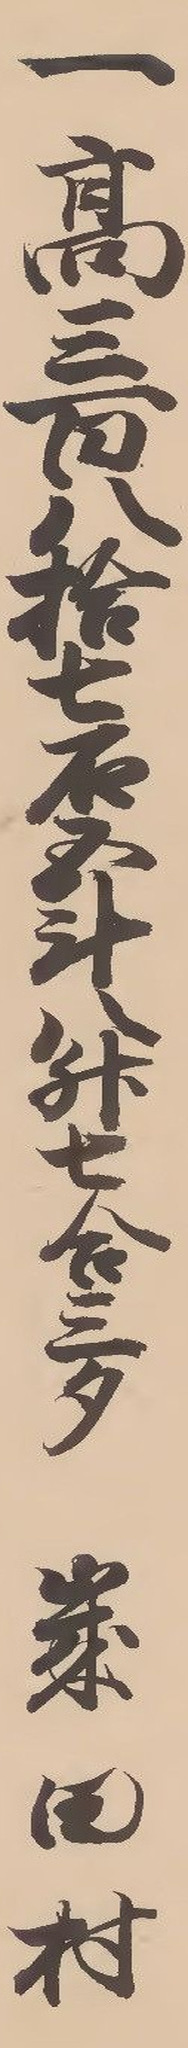一高三百八拾七石五斗八升七合三勺歳田村
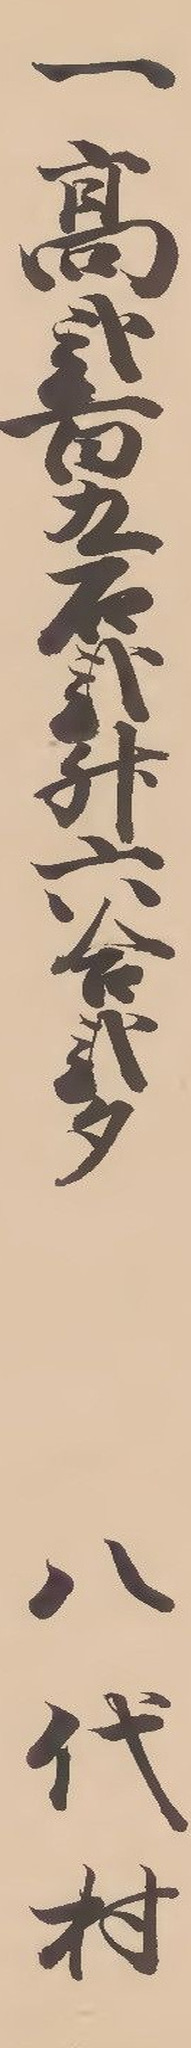一高弐百九石弐升六合弐勺八代村
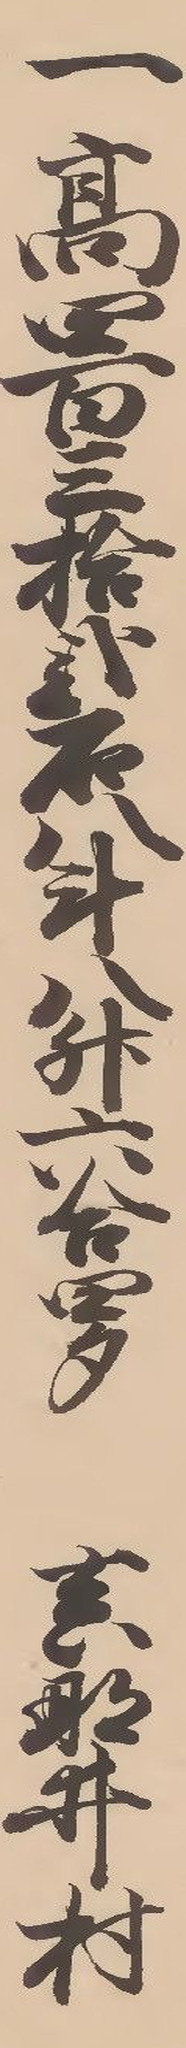一高四百三拾弐石八斗八升六合四勺真那井村
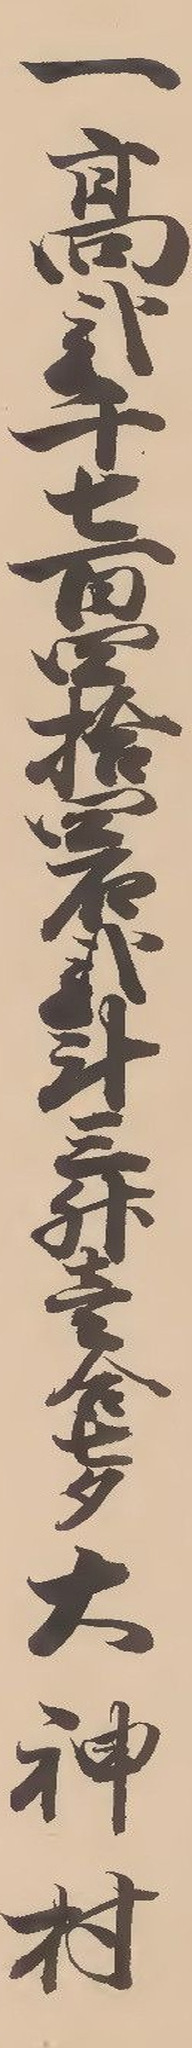一高弐千七百四拾四石弐斗三升壱合七勺大神村
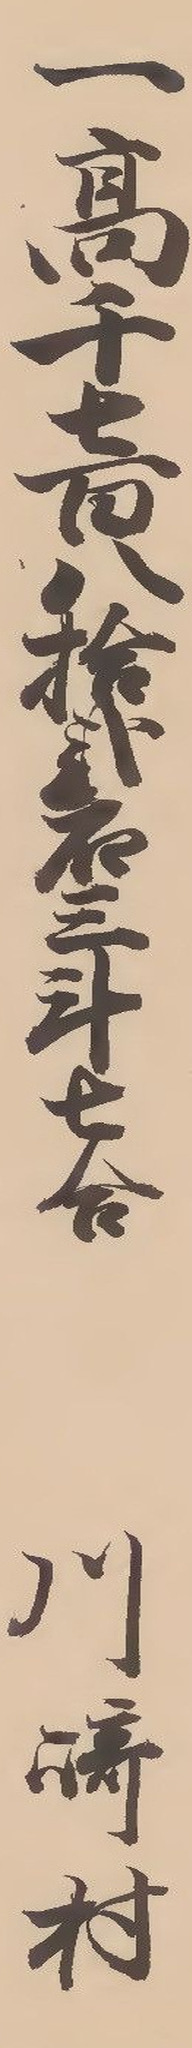一高千七百八拾弐石三斗七合川崎村
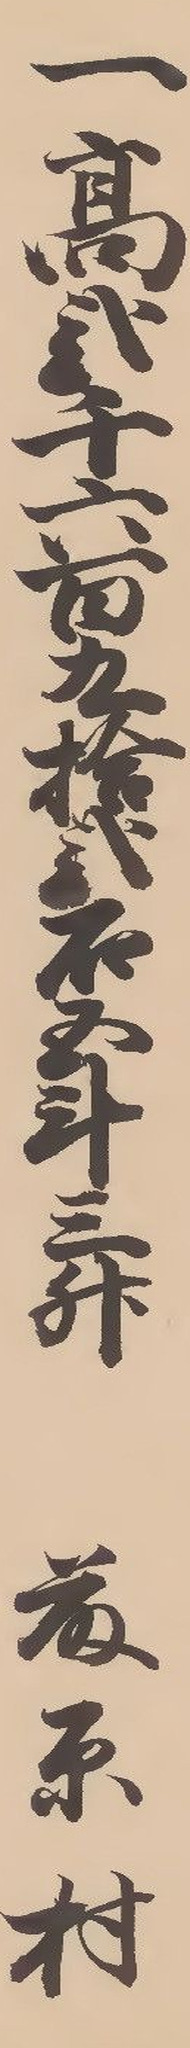一高弐千六百九拾弐石五斗三升藤原村
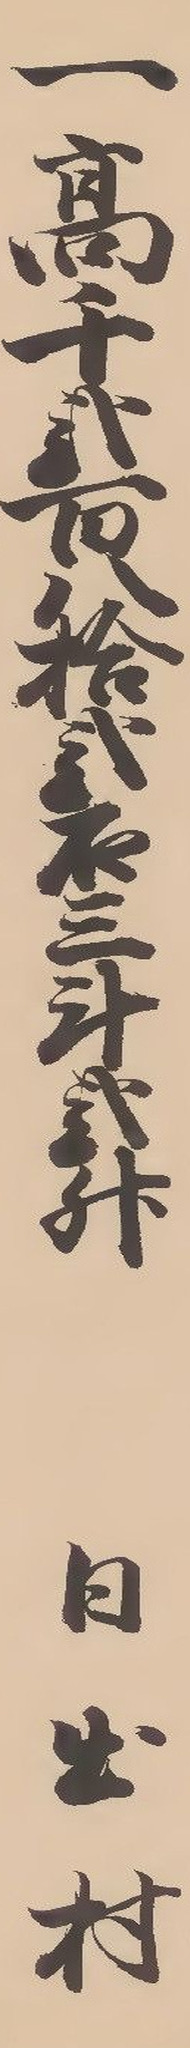一高千弐百八拾弐石三斗弐升日出村

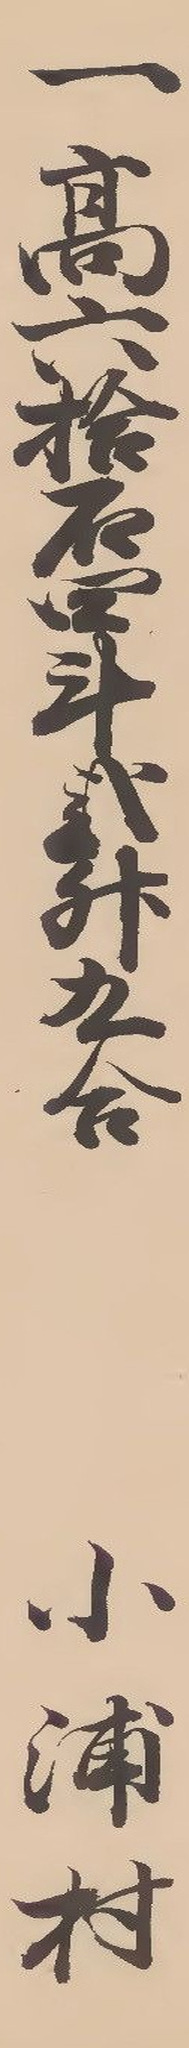一高六拾石四斗弐升九合小浦村
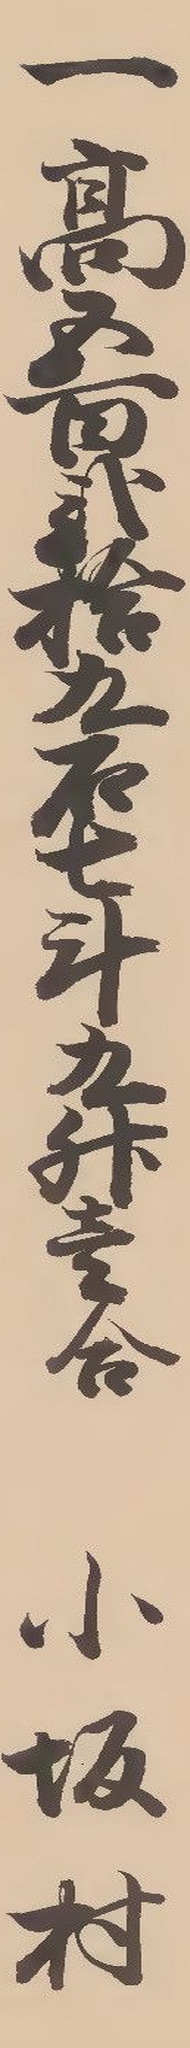一高五百弐拾九石七斗九升壱合小坂村
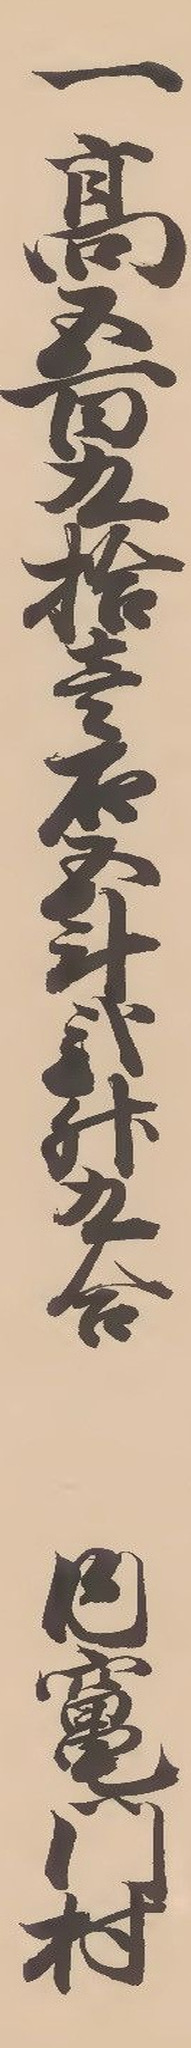一高五百九拾壱石五斗弐升九合内竃門村
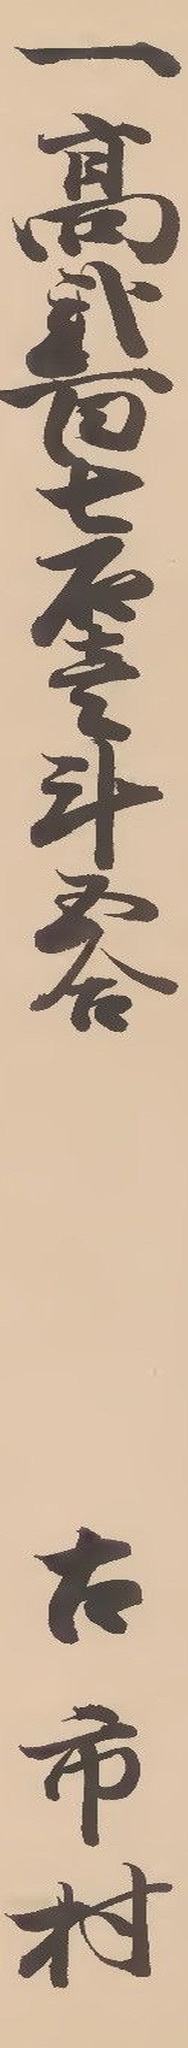一高弐百七石壱斗五合古市村
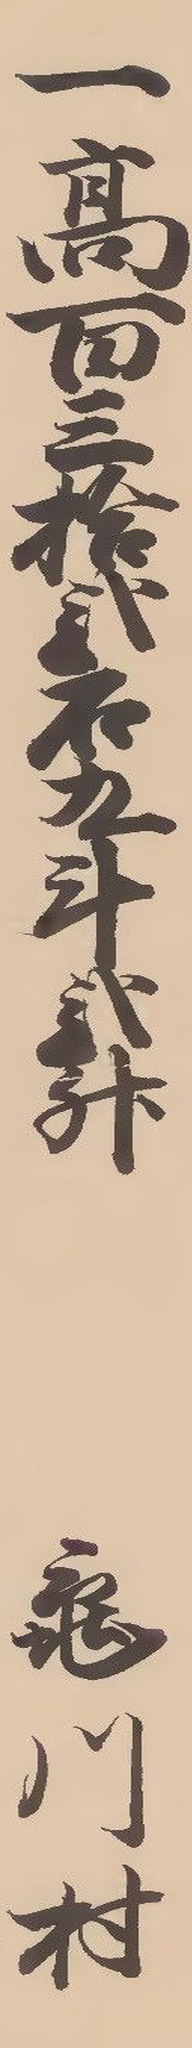一高百三拾弐石九斗弐升亀川村
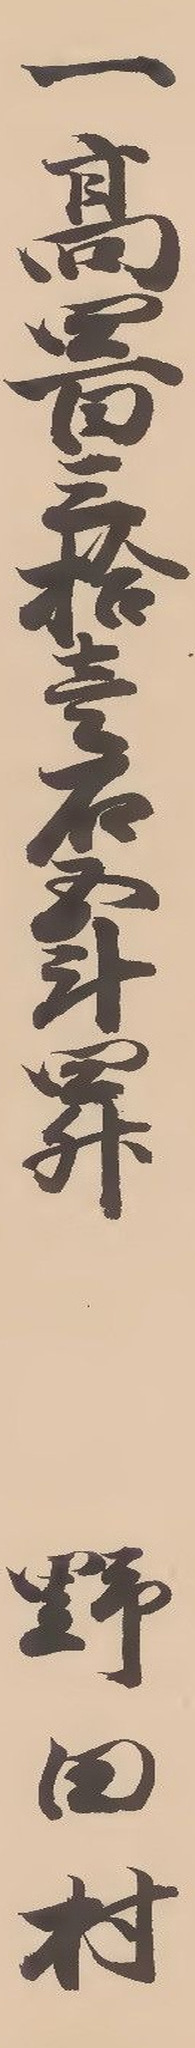一高四百三拾壱石五斗四升野田村
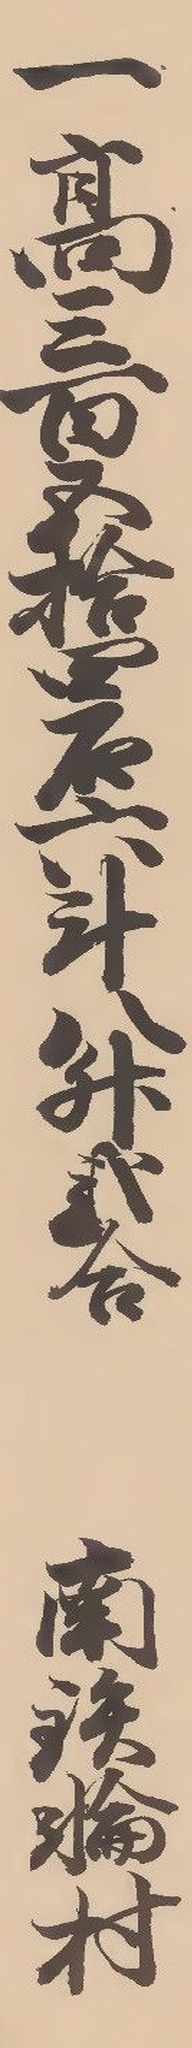一高三百五拾四石六斗八升弐合南鉄輪村

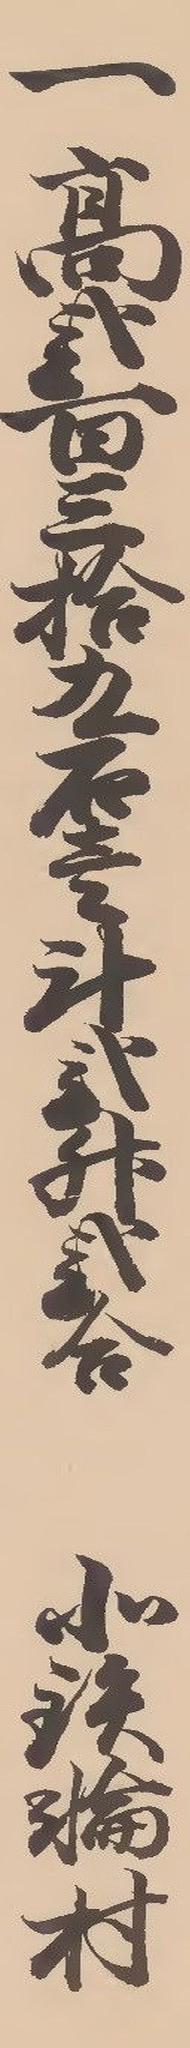一高弐百三拾九石壱斗弐升弐合北鉄輪村
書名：豊後国郷帳
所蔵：国立公文書館 National Archives of Japan
